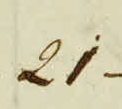21
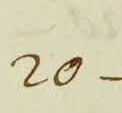20
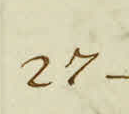27
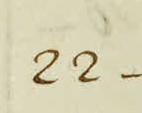22
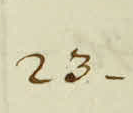23
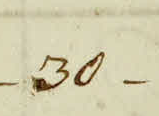30
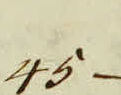45
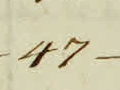47
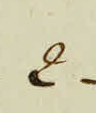2
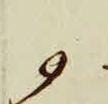9
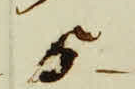5
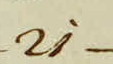21
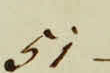51
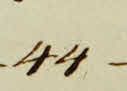44
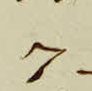7
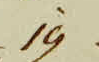19
